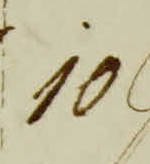10
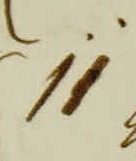11
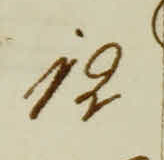12
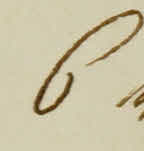6
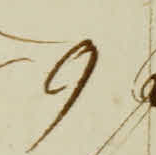9
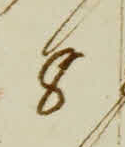8
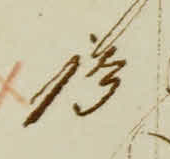13
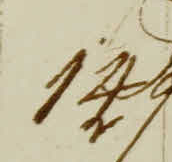14
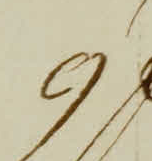9
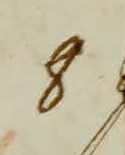8
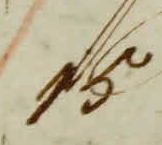15
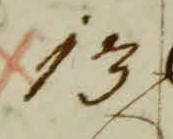13
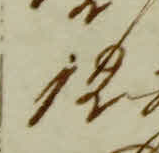12
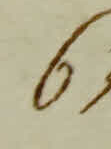6
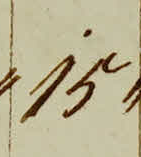15
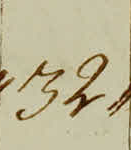32
